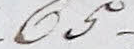65
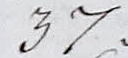37
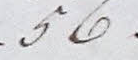56
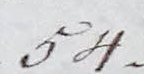54
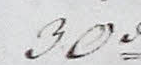30
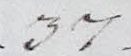37
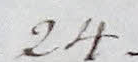24
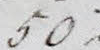50
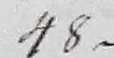48
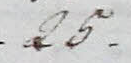25
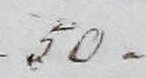50
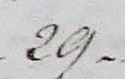29
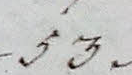53
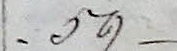59
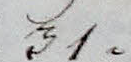31
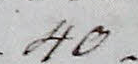40
